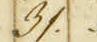31.
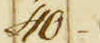40
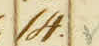14.
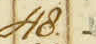48.
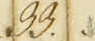33.
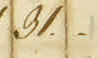31.
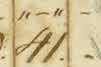41.
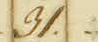31.
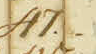47.
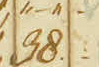38.
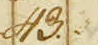43.
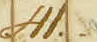41.
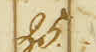25.
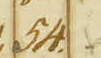54.
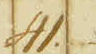41.
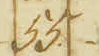55.
